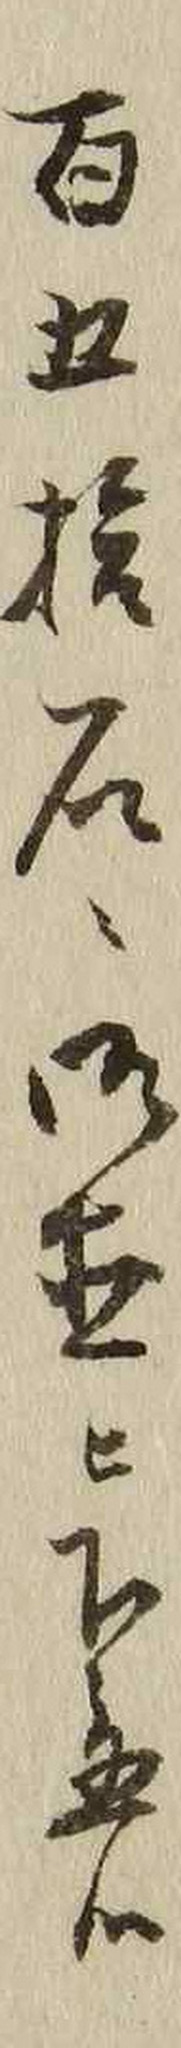百五拾石ニ御直被下置候
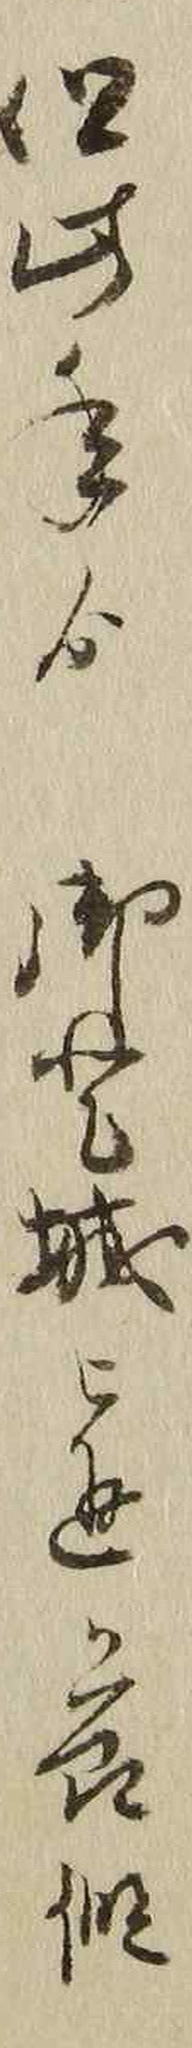但此年ゟ御登城被遊候節仮
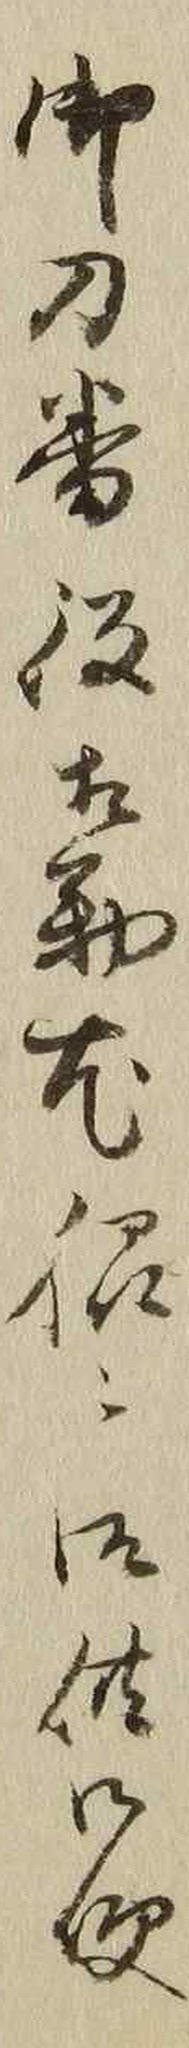御刀番役相勤尤脇ニ御供御使
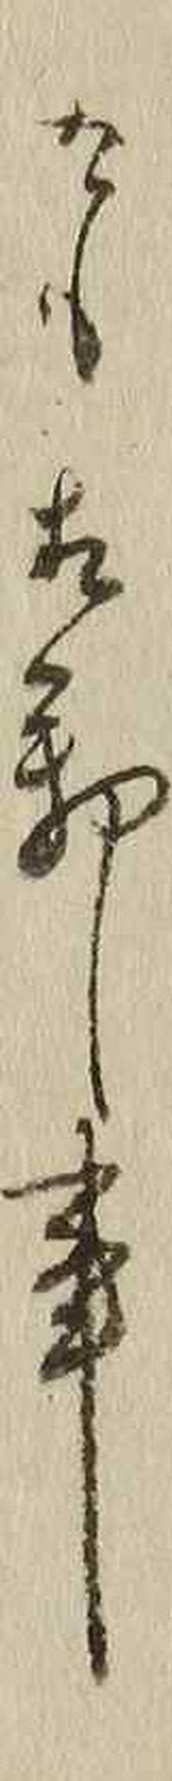をも相勤候事
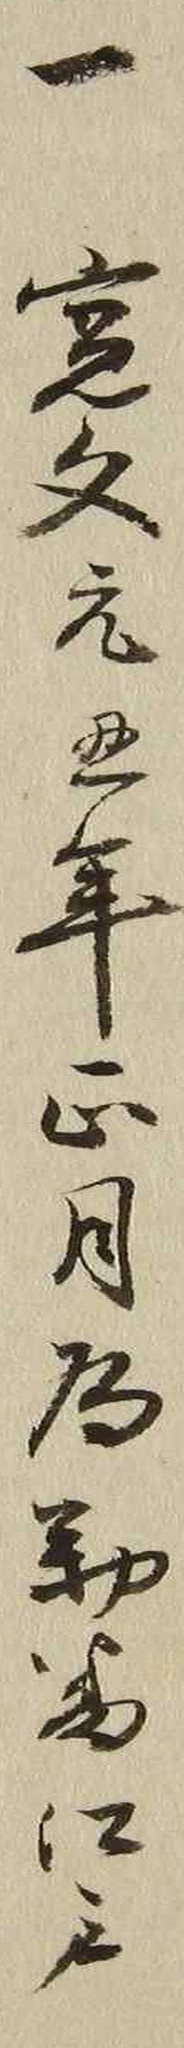一寛文元丑年正月為勤番江戸
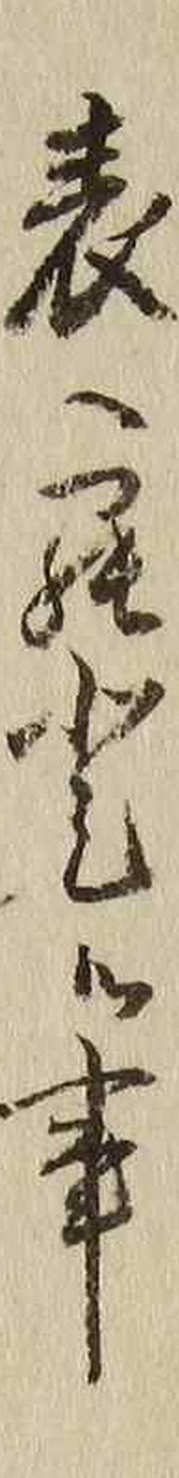表へ罷登候事
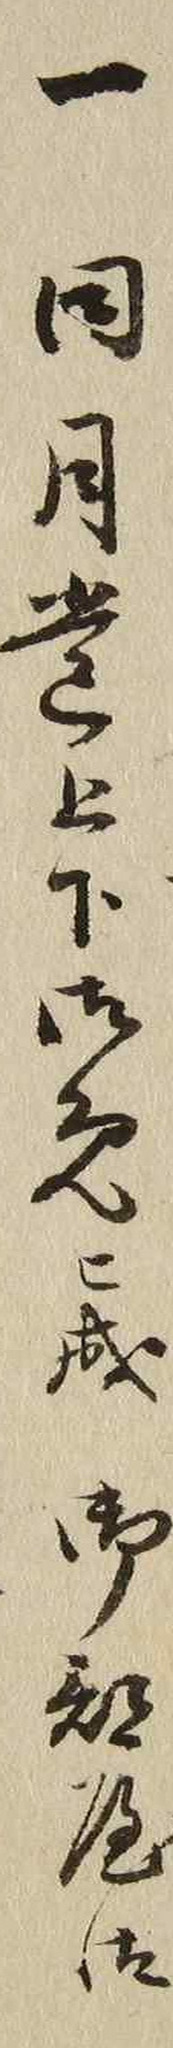一同月常上下御免被成御部屋御
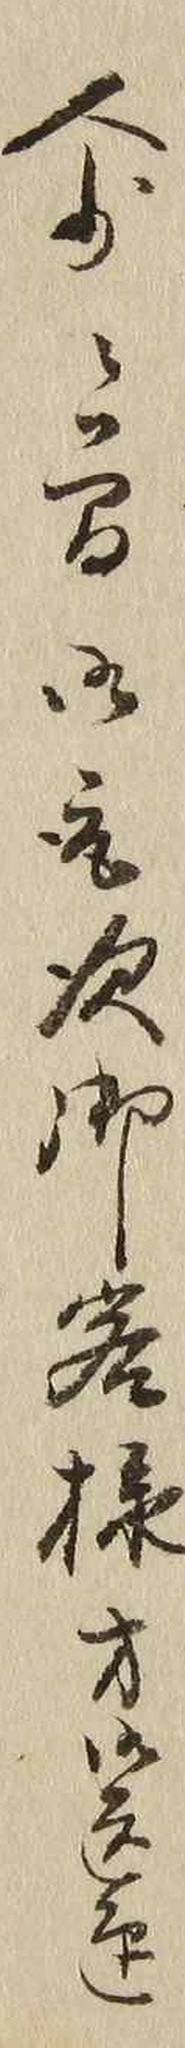人少ニ候間御取次御客様方御送迎
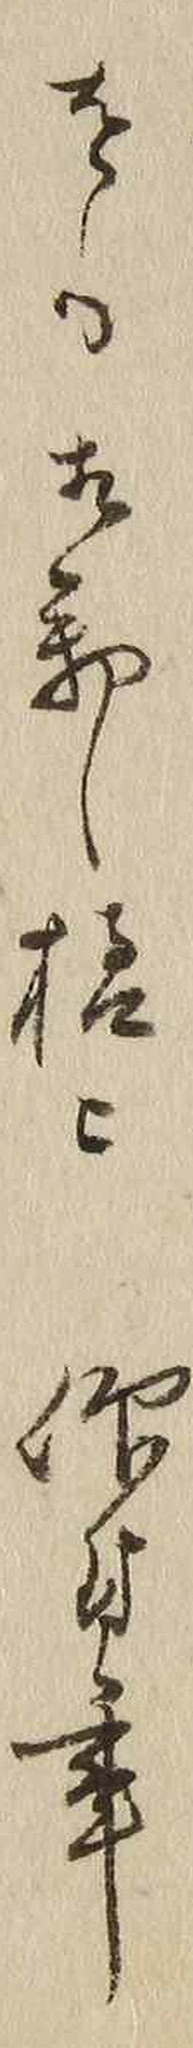をも相勤候様被仰付候事
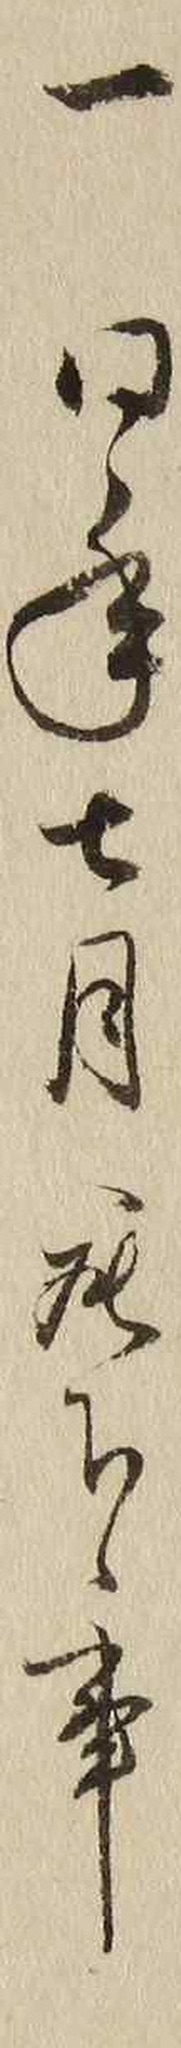一同年七月罷下候事
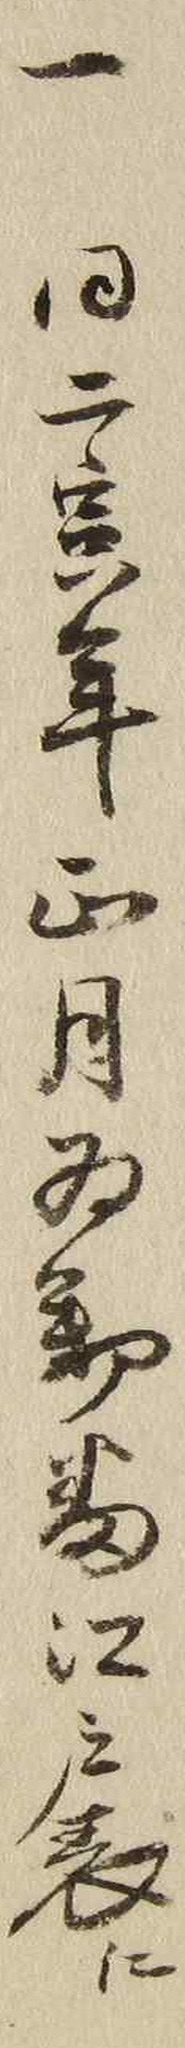一同二寅年正月為勤番江戸表江
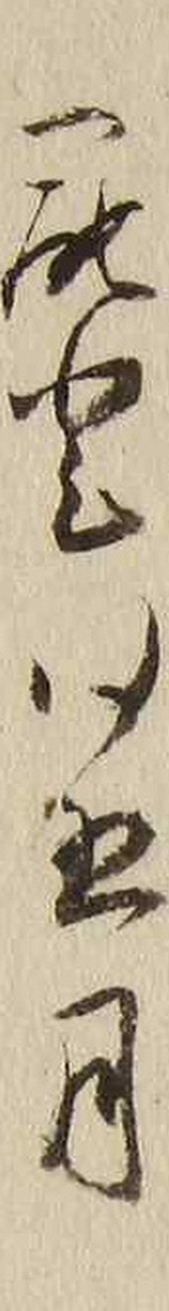罷登同五月
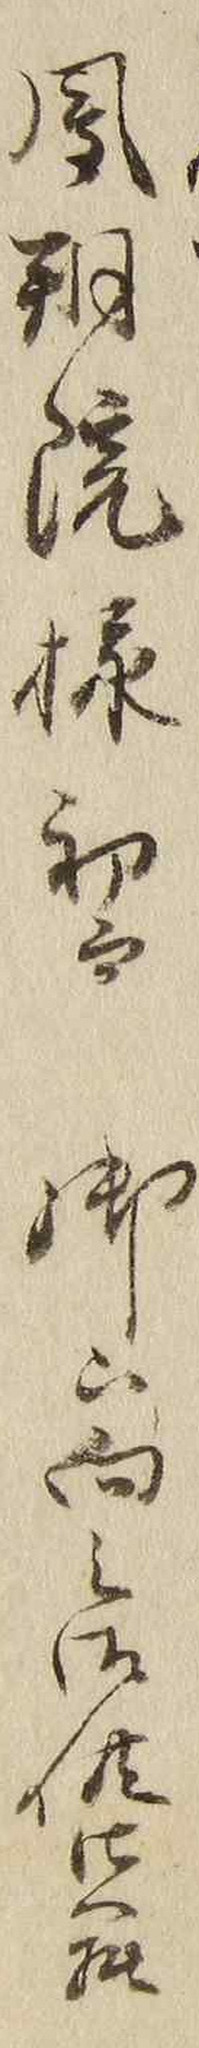鳳翔院様初而御下向之御供仕罷
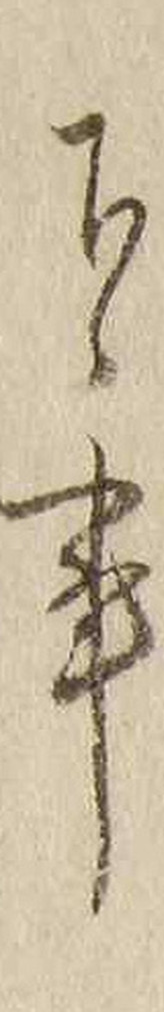下候事
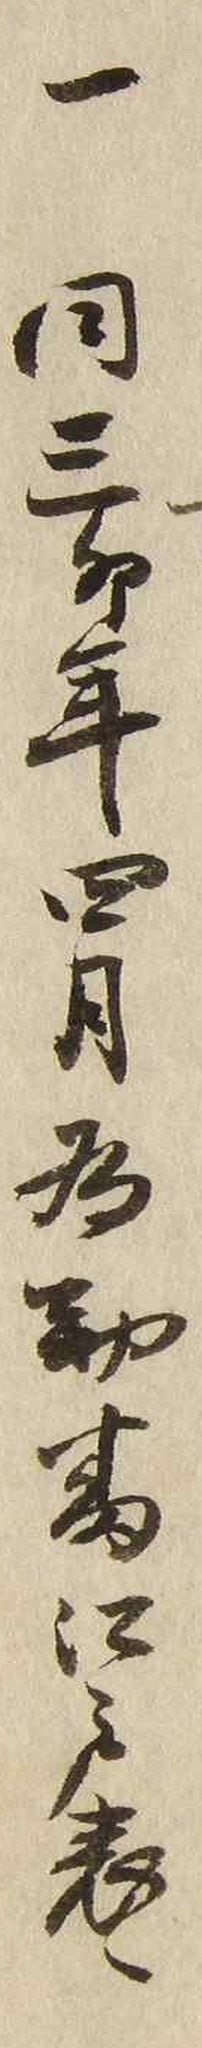一同三卯年四月為勤番江戸表へ

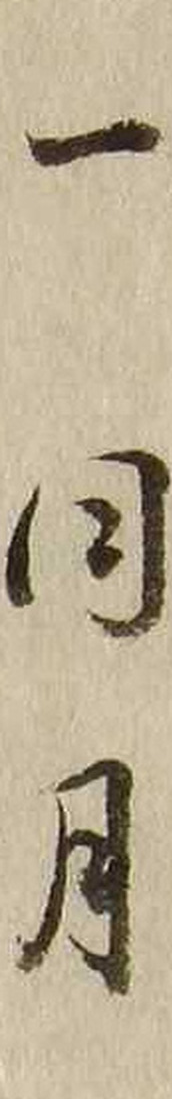一同月
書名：諸士系譜　巻之225　ま之部6
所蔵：会津若松市立会津図書館
